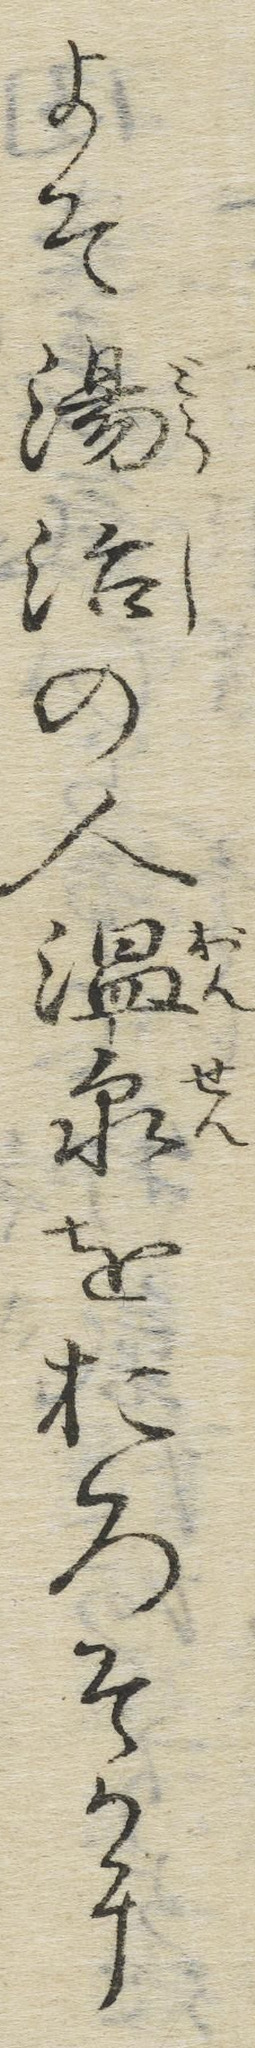よそ湯治の人温泉をおろそかに
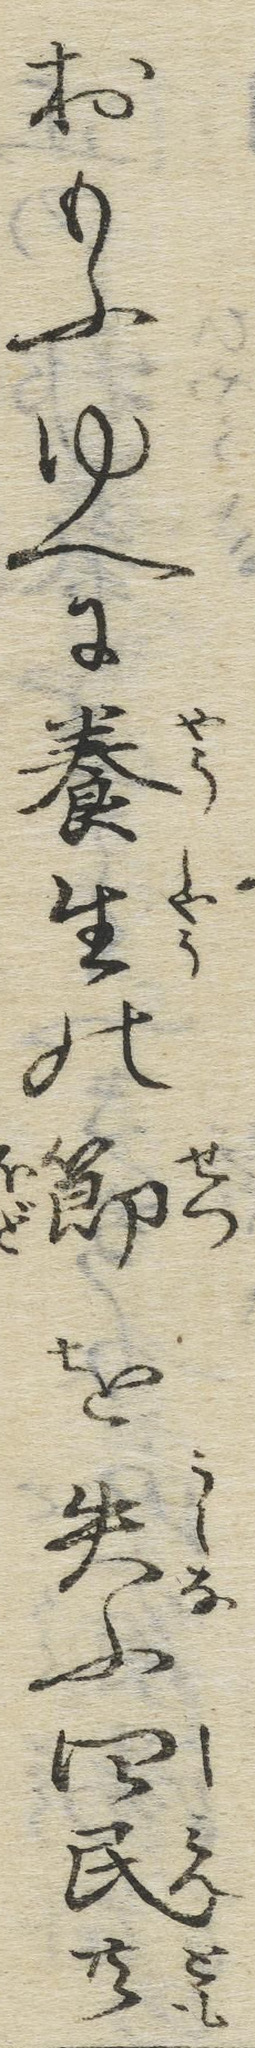おもふゆへに養生の節を失ふ四民共
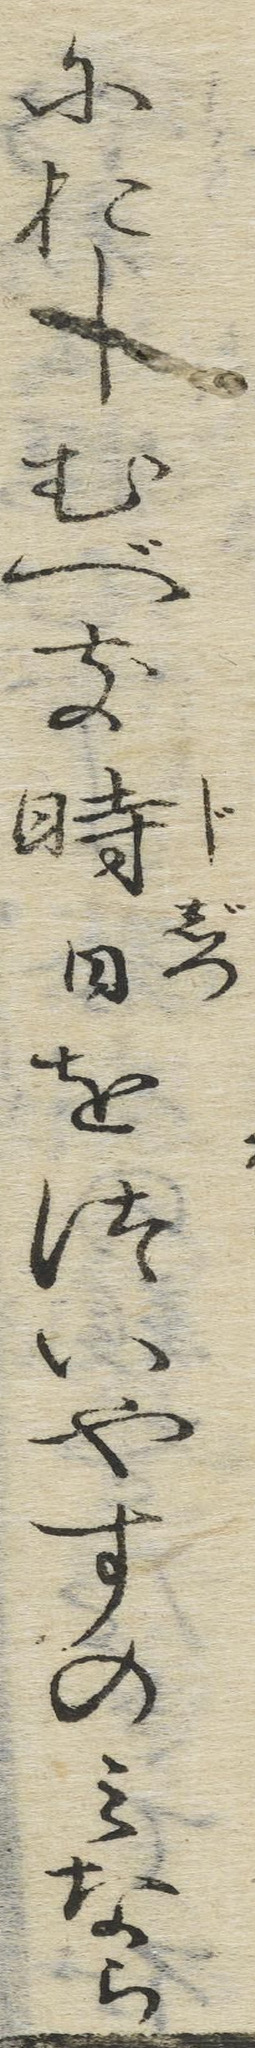におしむべき時日をついやすのみなら
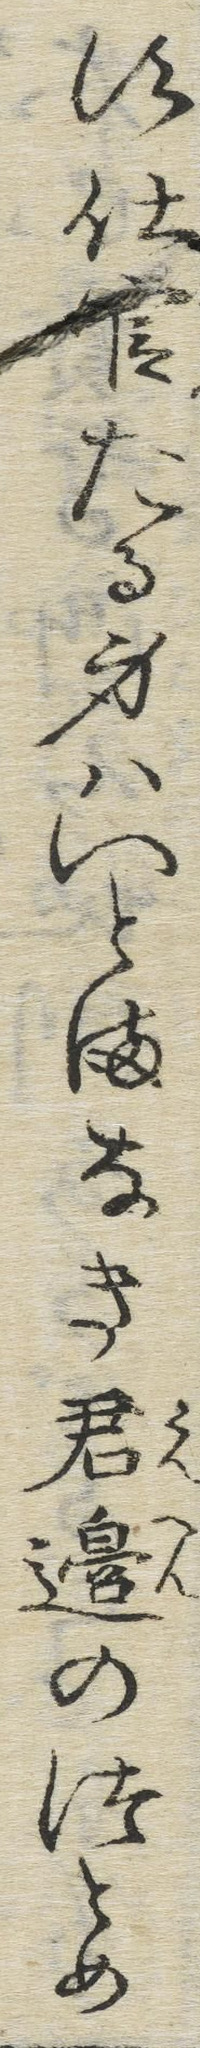す仕官たる身はいとまなき君辺のつとめ
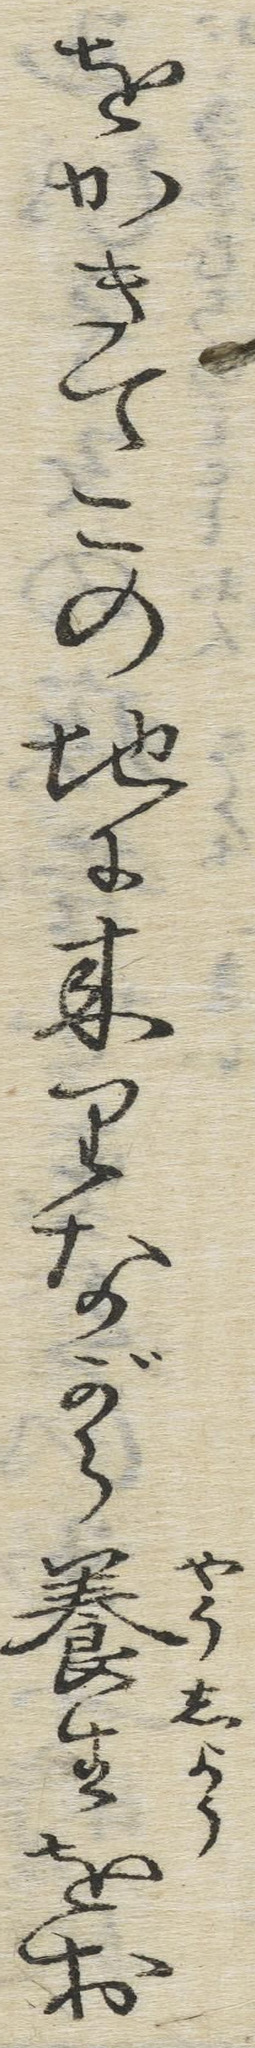をかきてこの地に来りながら養生をお
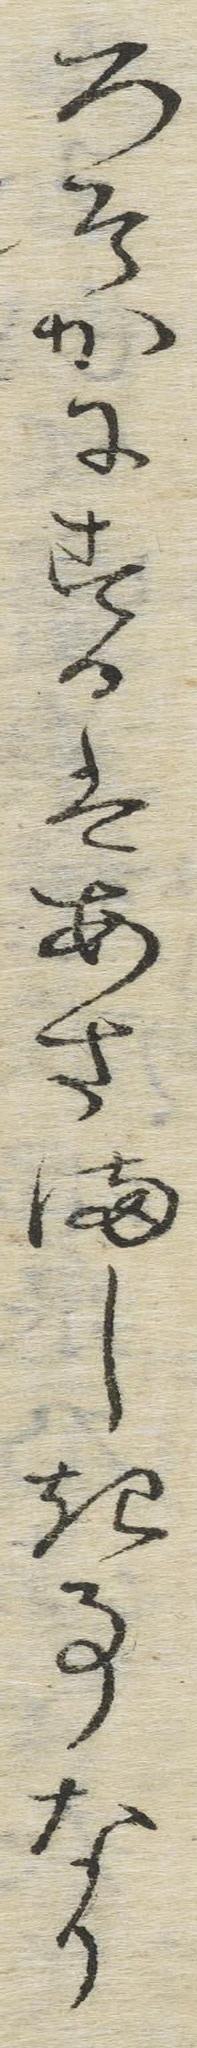ろそかにするはあさましき事なり
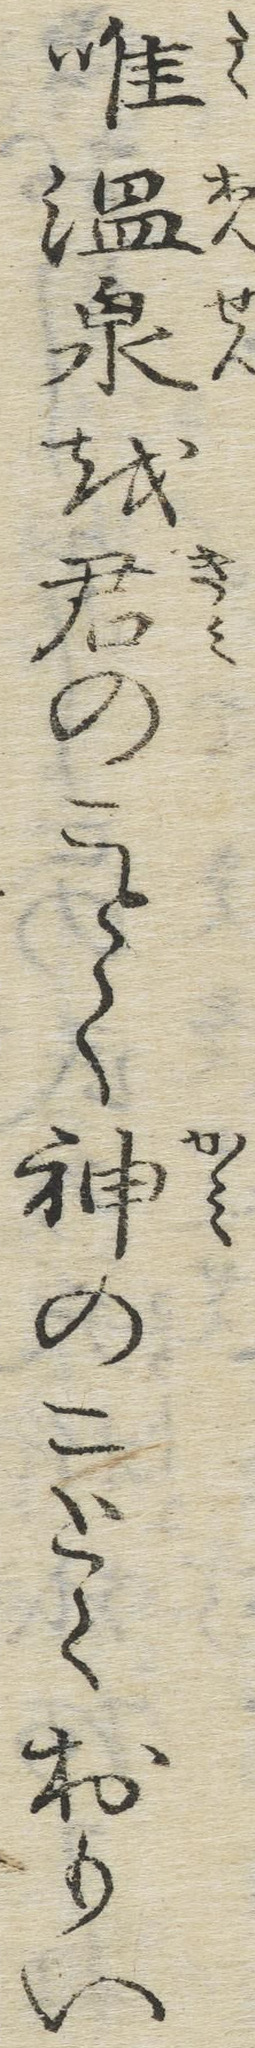唯温泉を君のことく神のことくおもい
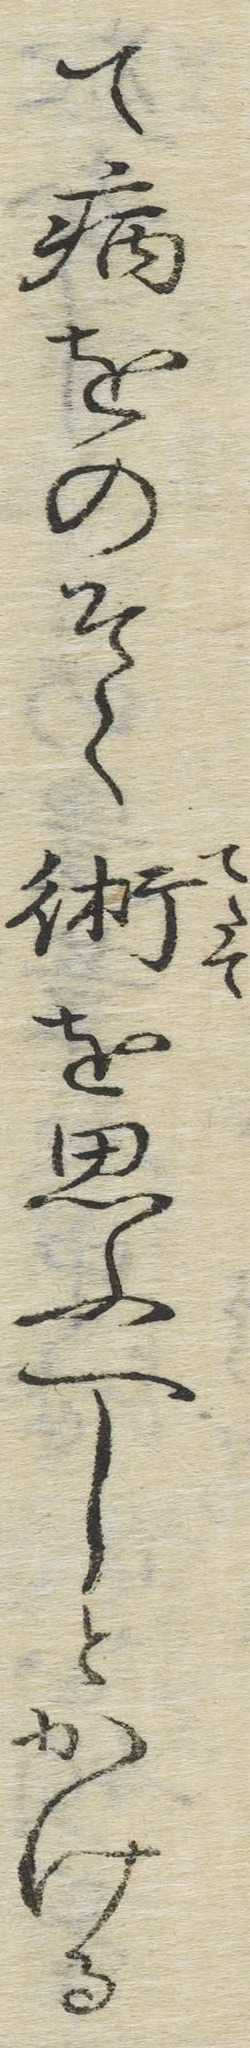て病をのそく術を思ふへしとかける
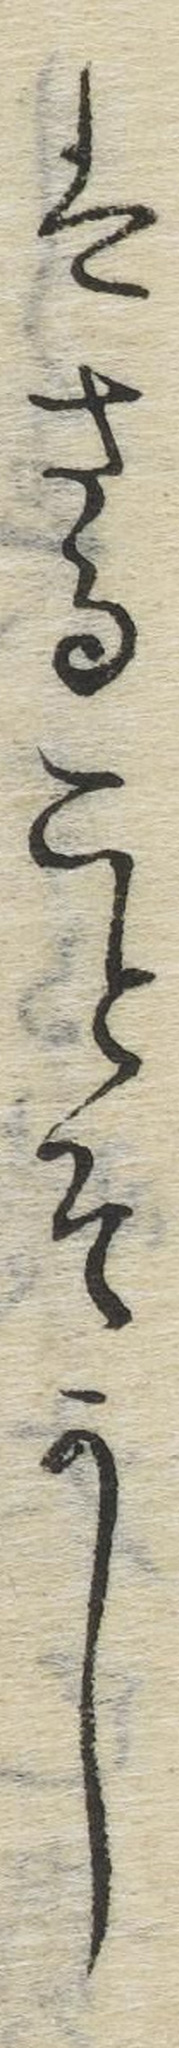はさることそかし
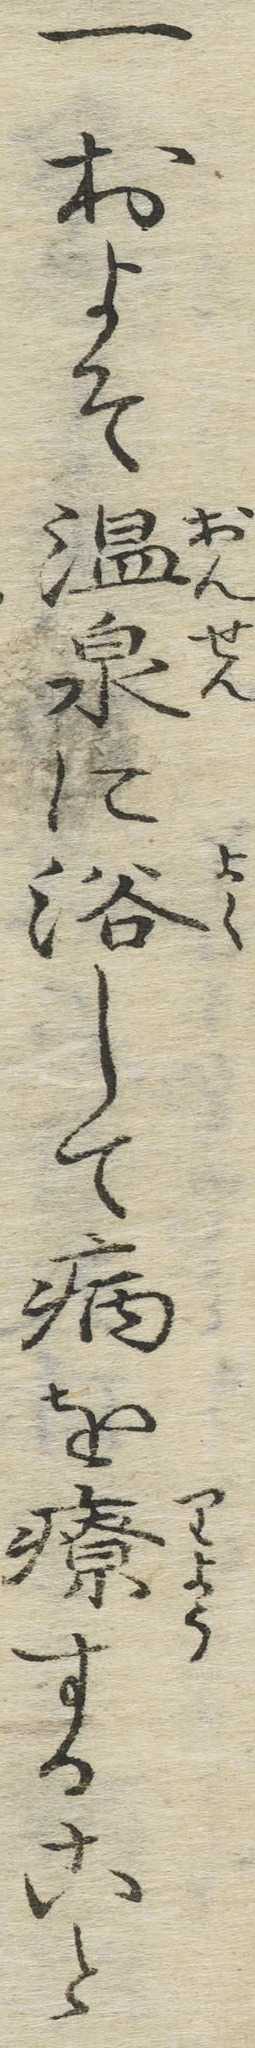一およそ温泉に浴して病を療すること
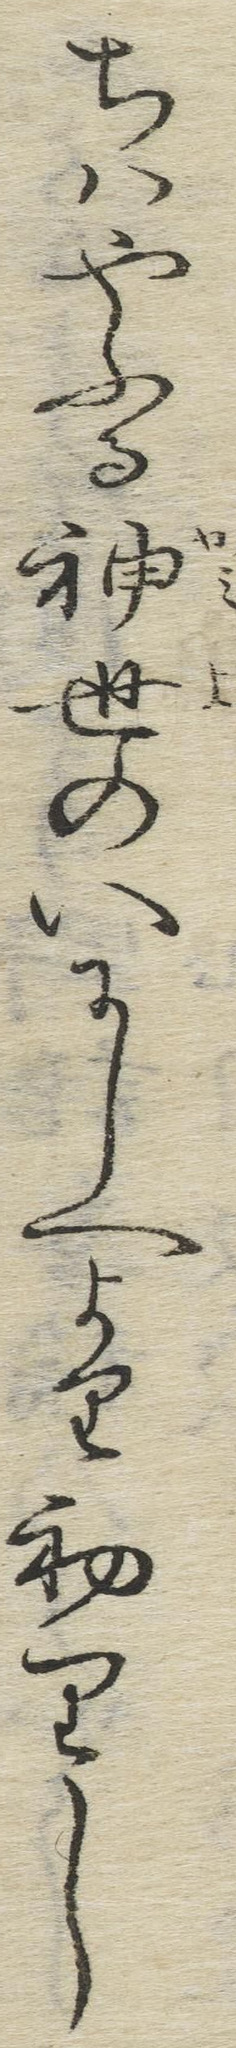ちはやふる神世のいにしへより初りし

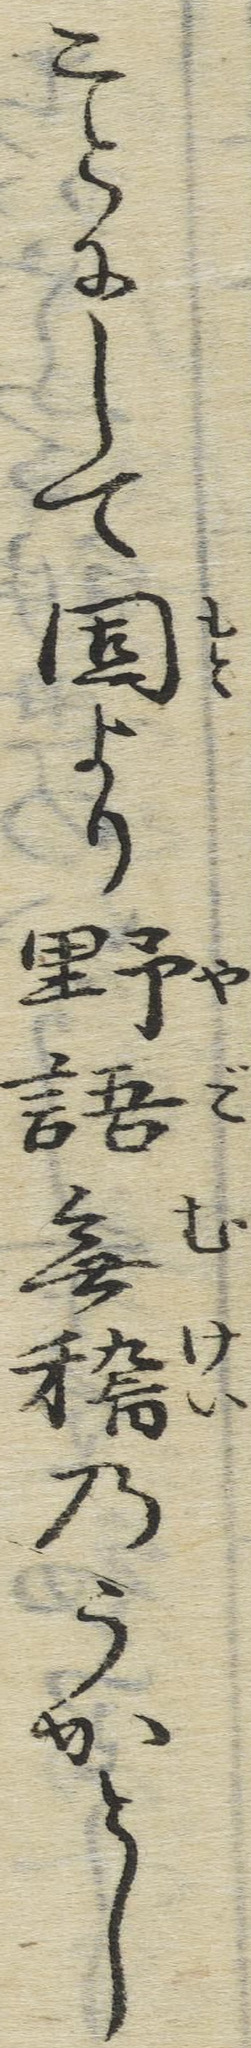ことにして固より野語無稽のうかとし
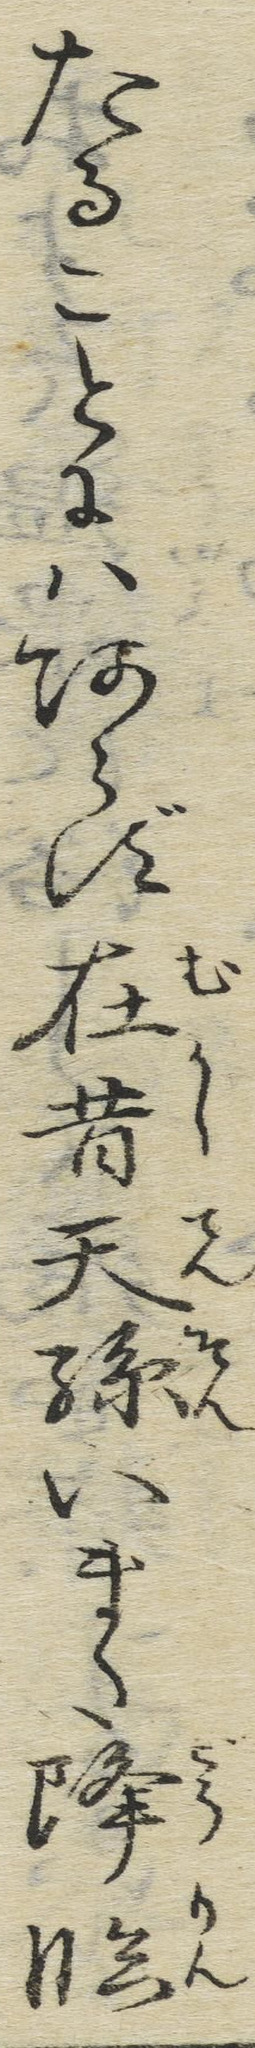たることにはあらず在昔天孫いまた降臨
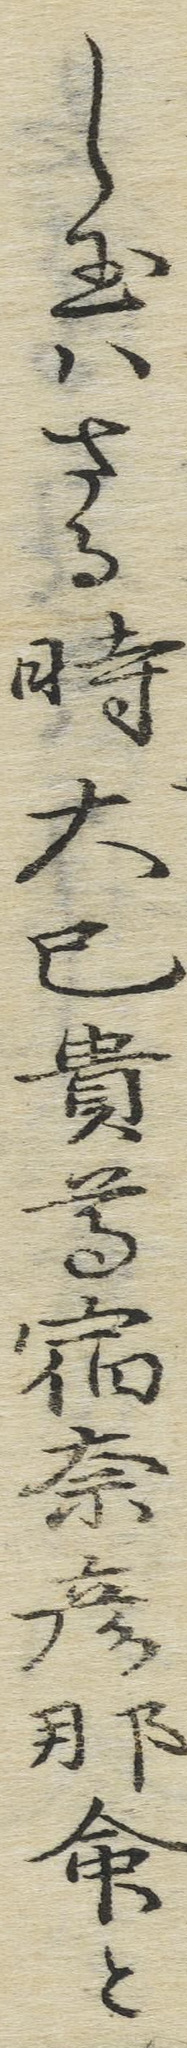し玉はさる時大巳貴尊宿奈彦那命と
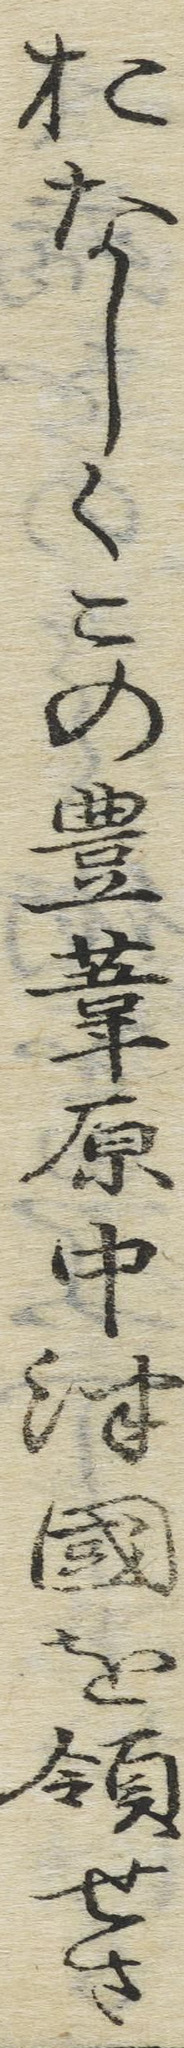おなしくこの豊葦原中津国を領せさ
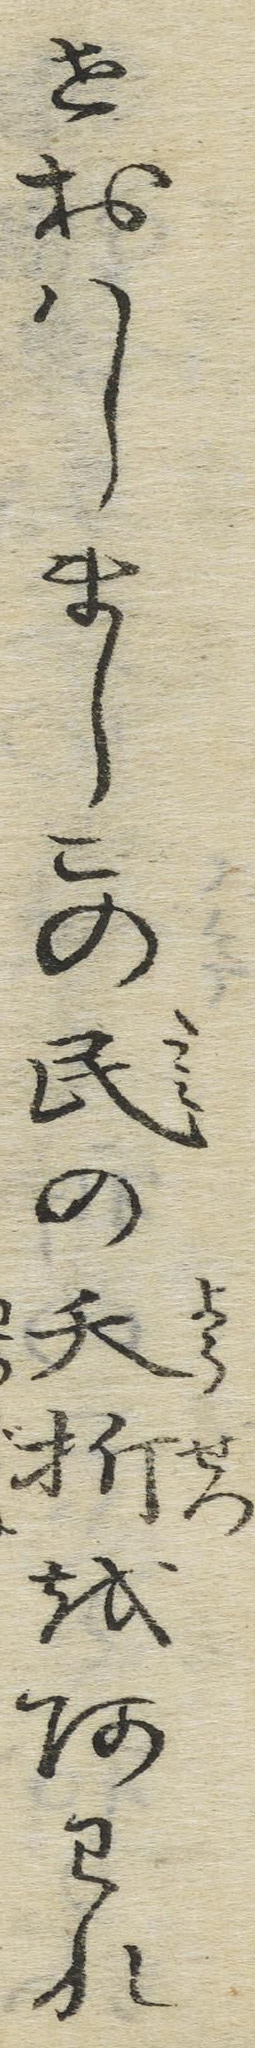せおはしましこの民の夭折をあわれ
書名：温泉考
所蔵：東京大学地震研究所図書室 Earthquake Research Institute Library, The University of Tokyo, JAPAN
